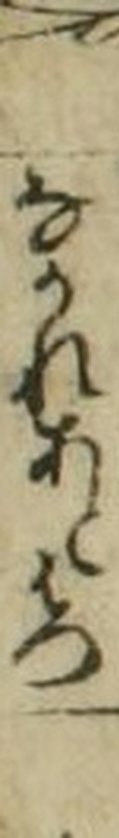なかれあとはつ
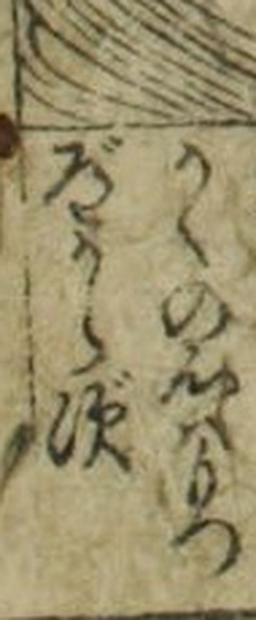べからず

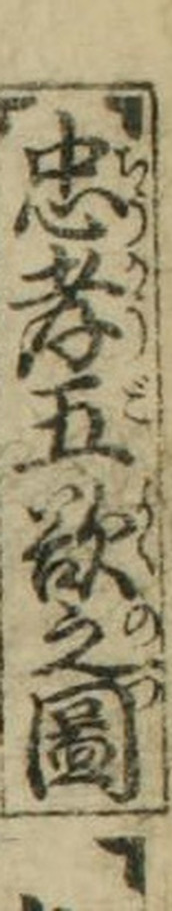忠孝五欲之圖
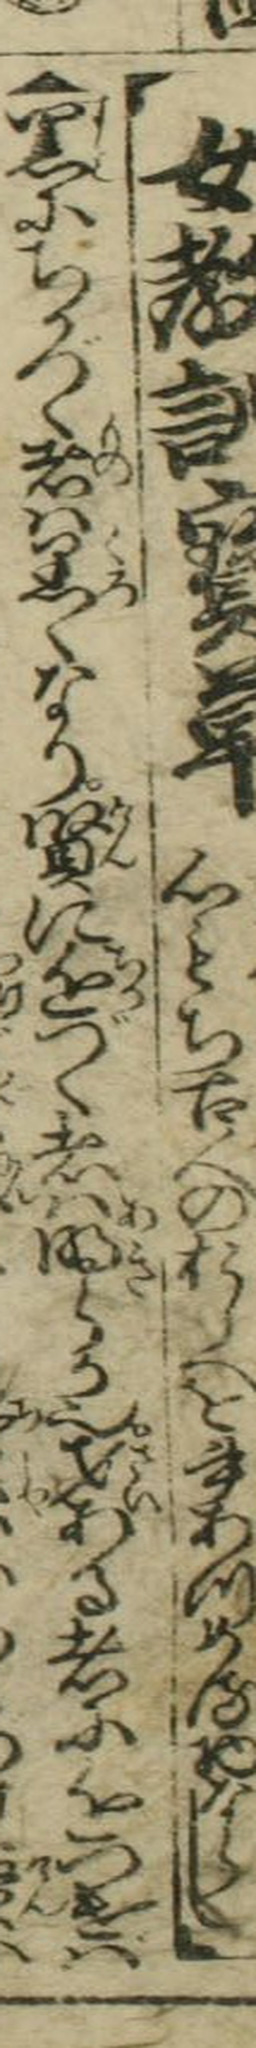▲黒にちかづく者は黒くなり。賢に近づく者は明らか也。才ある者に近つけば
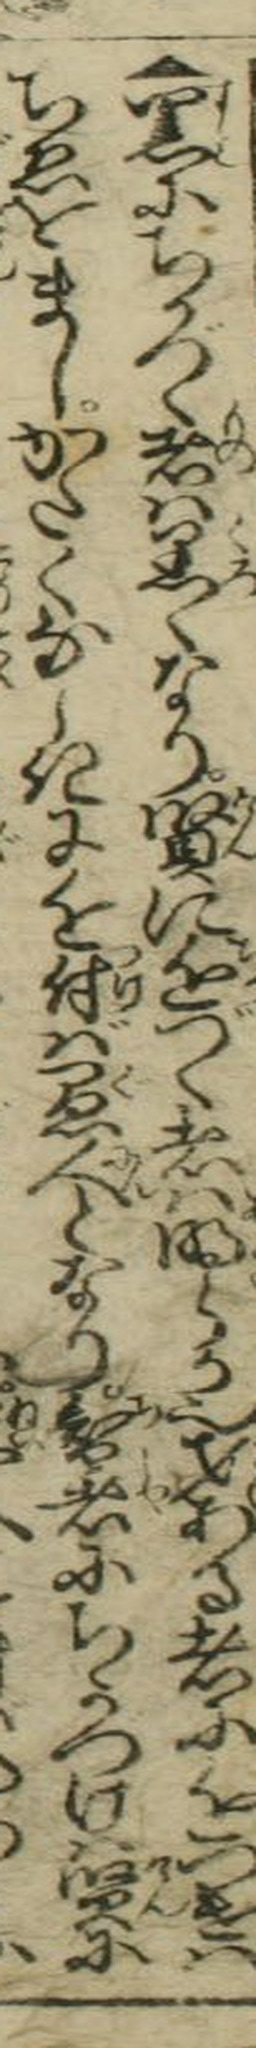ちゑをまし。かたくるしきに近付ば愚人となり。智者にちかつけば賢に
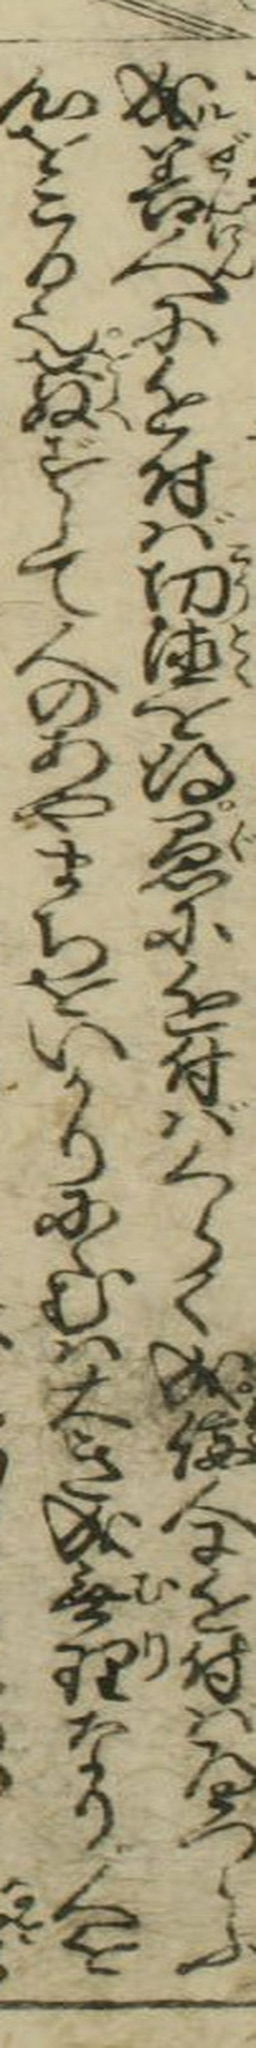心をこる也。教ずして人のあやまちをいかりにくむは大き成無理なり。人を
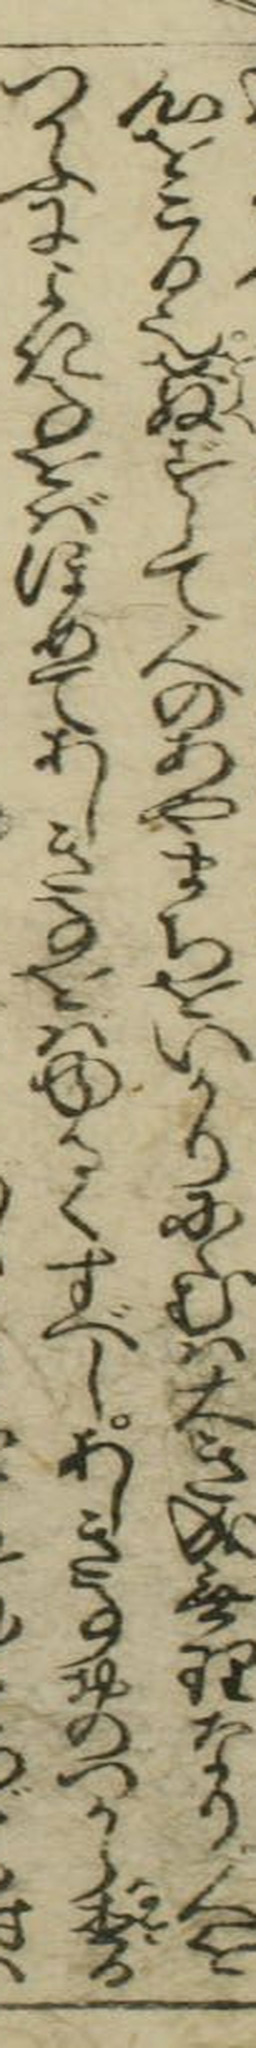つかふによき事をばほめてあしきことをばゆるくすべし。あしき事おのつから直る
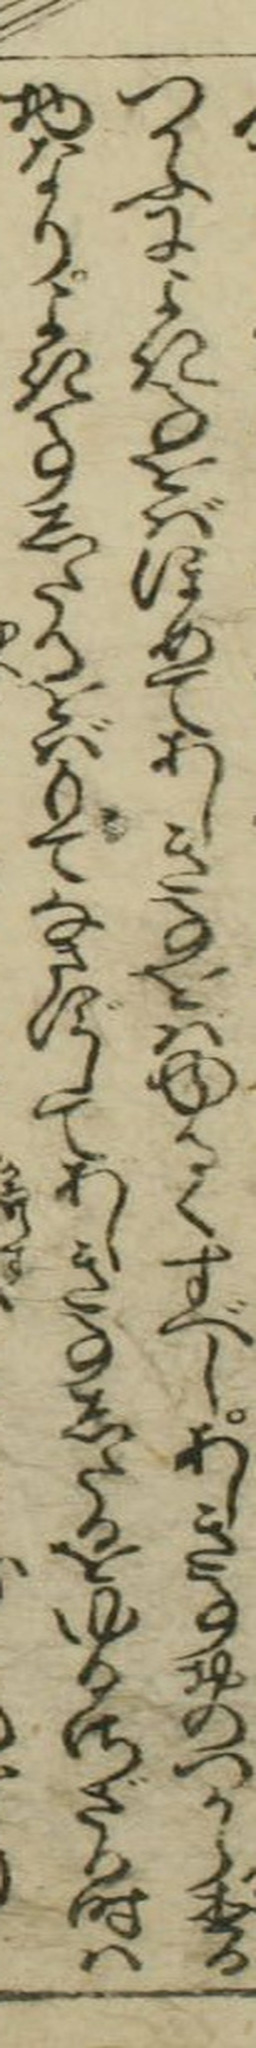物なり。よき事したるをばもてなさずしてあしき事したるをゆるさざる時は
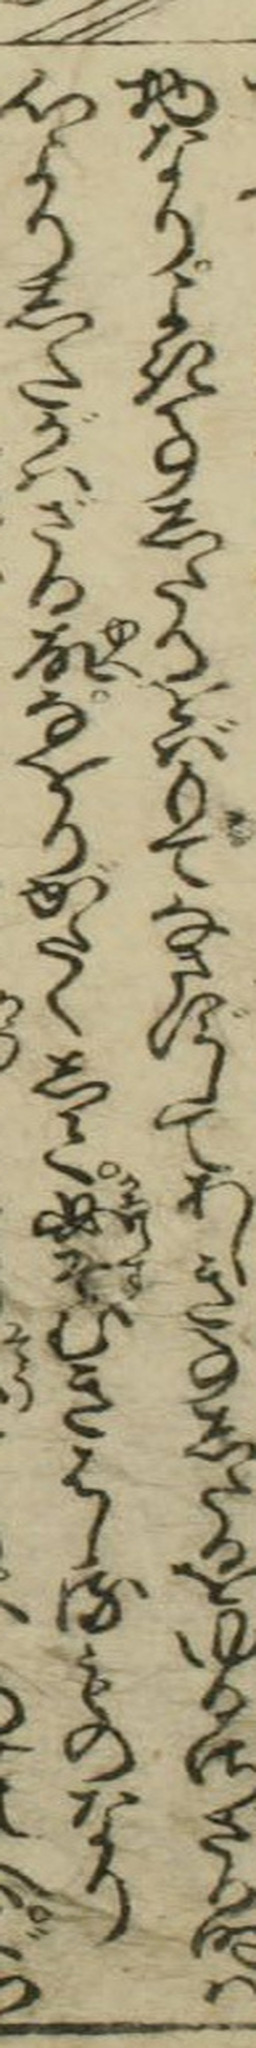心よりしたがはざる故。なをりがたくして。必そむきはしるものなり
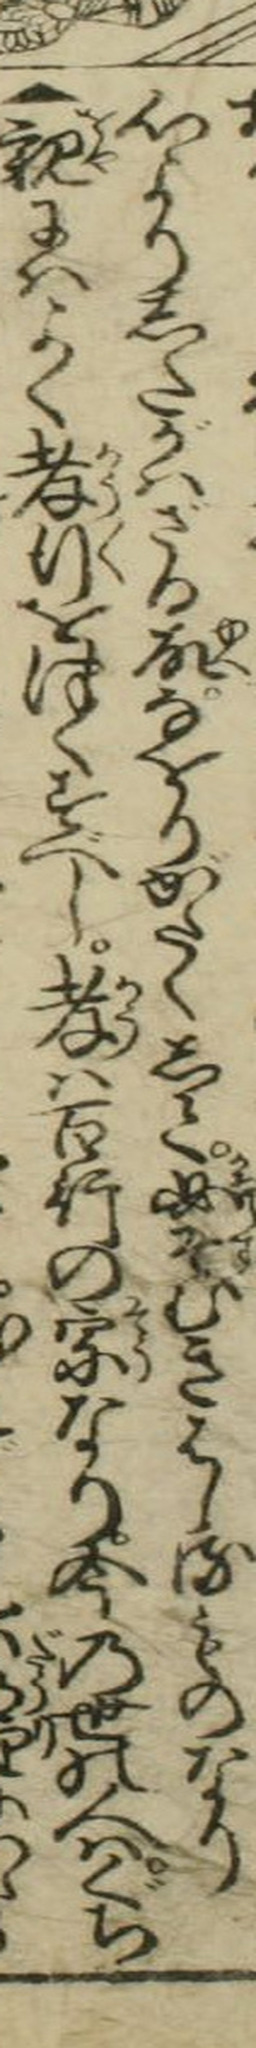▲親にはよく孝行をつくすべし。孝は百行の宗なり。今の世の人は。ぐち
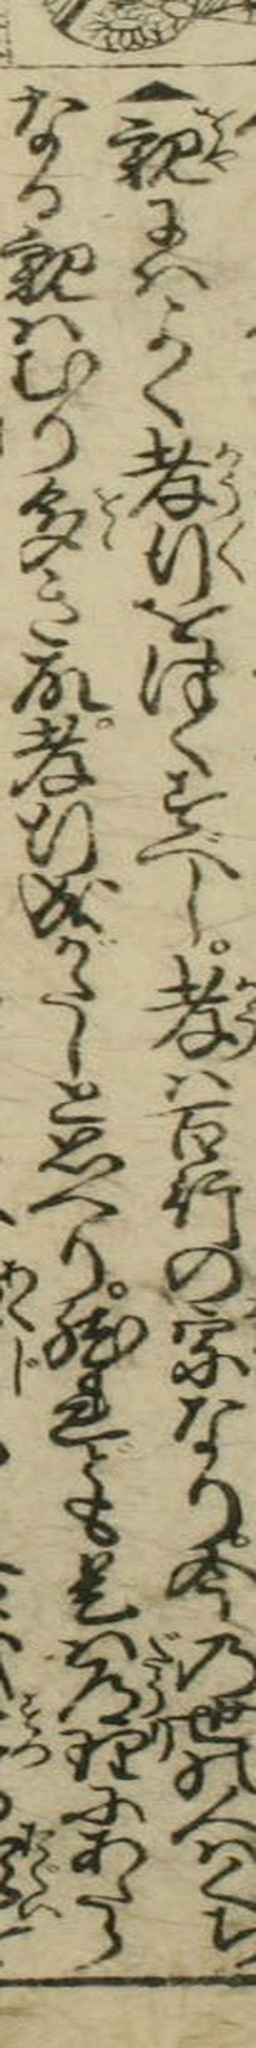なる親はむり多き故。孝行成りがたしと思へり。然れども是は道理にあたら
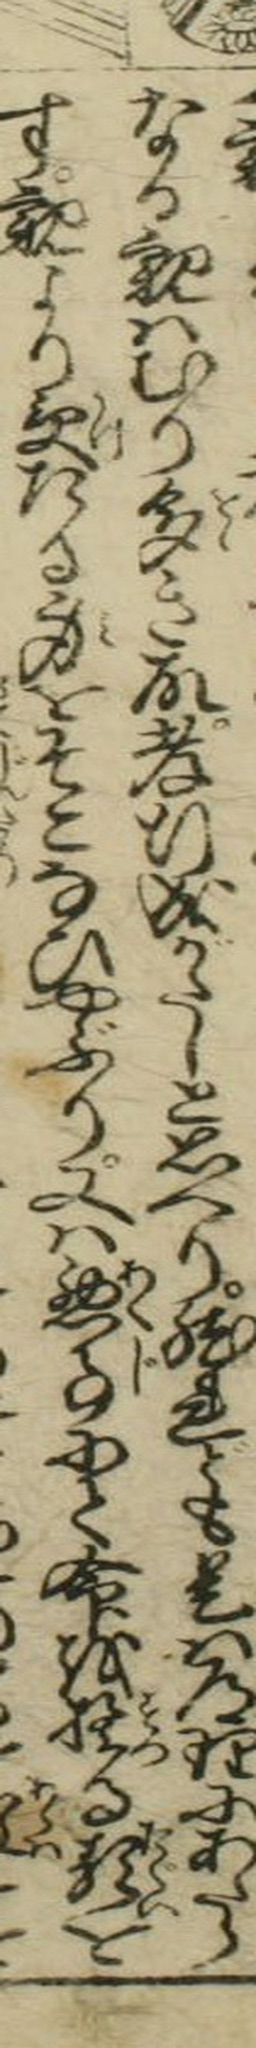す。親より受たる身をそこなひやぶり。又は悪事にて命を捨る類を
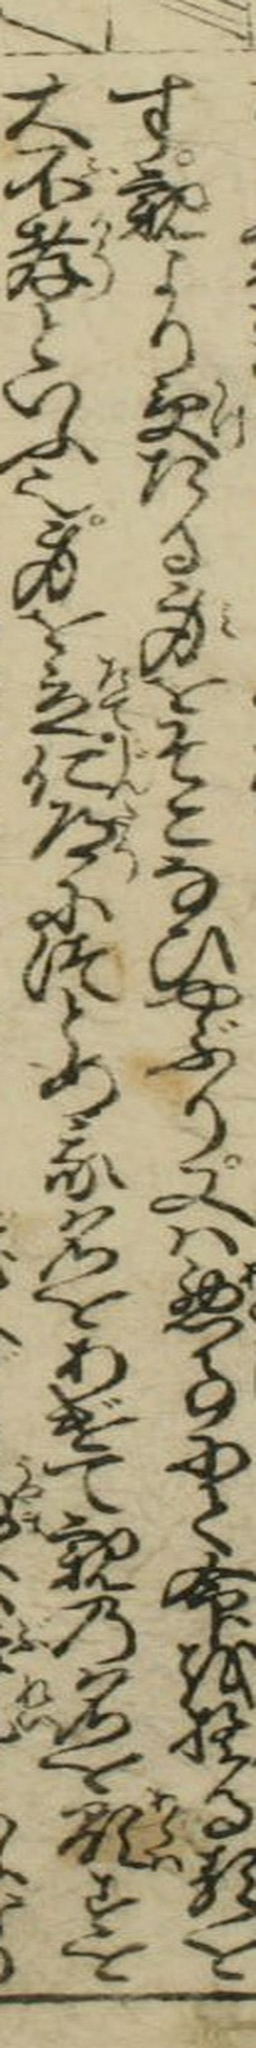大不幸といふ也。身を立仁道につとめ家名をあげて親の名を顕すを
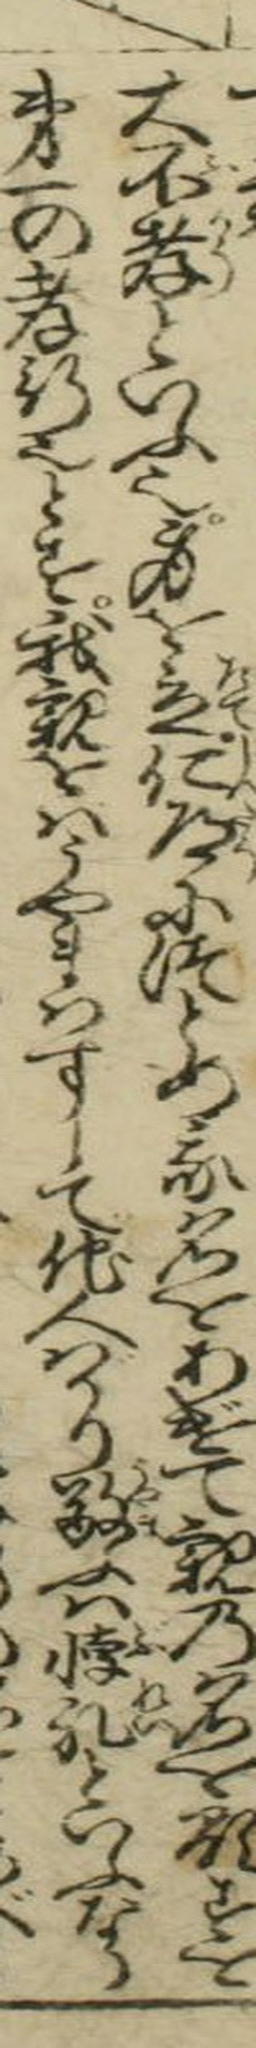第一の孝行也とす。我親をはうやまはすして他人ばかり敬ふは悖礼といふなり
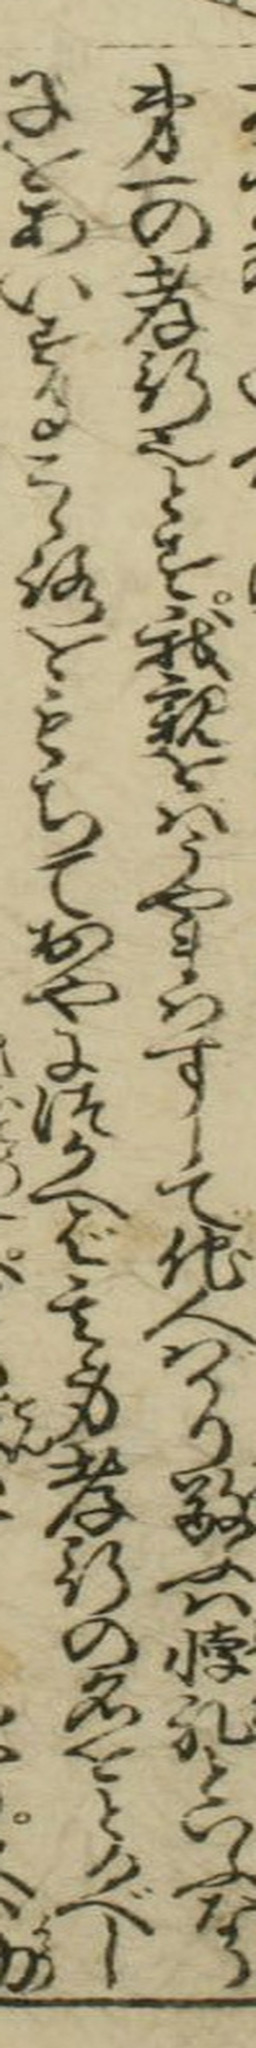子をあいするこゝろをもちておやにつかへば其身孝行の名をとるべし
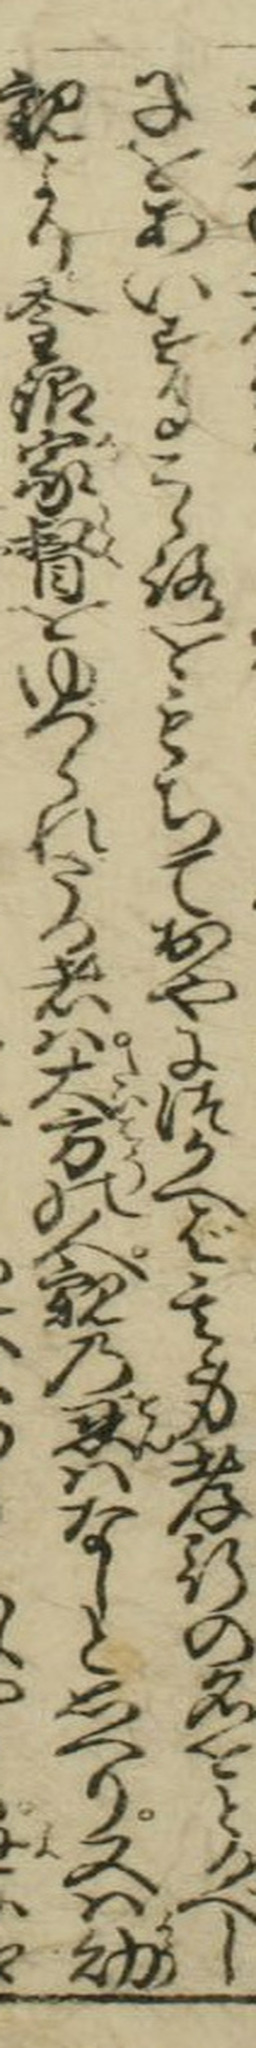親より金銀家督をゆつられたる者は。大方の人。親の恩はなしと思へり。または幼
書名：女源氏教訓鑑
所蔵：東京学芸大学附属図書館
